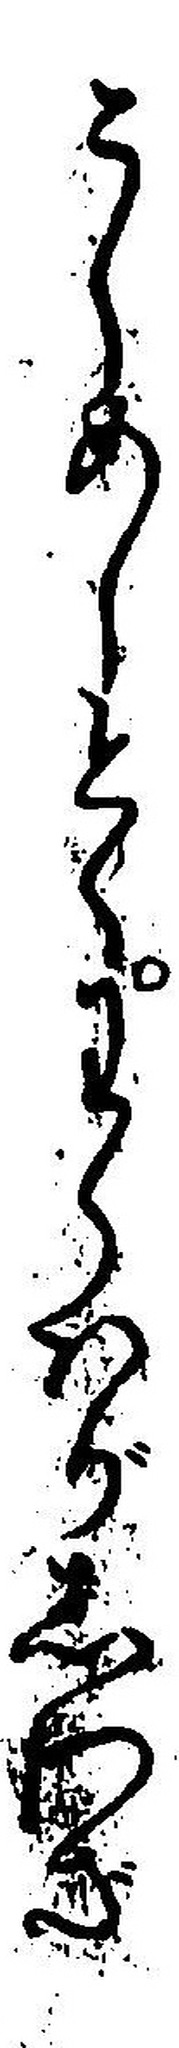こしめしとく。わらはがしわざ
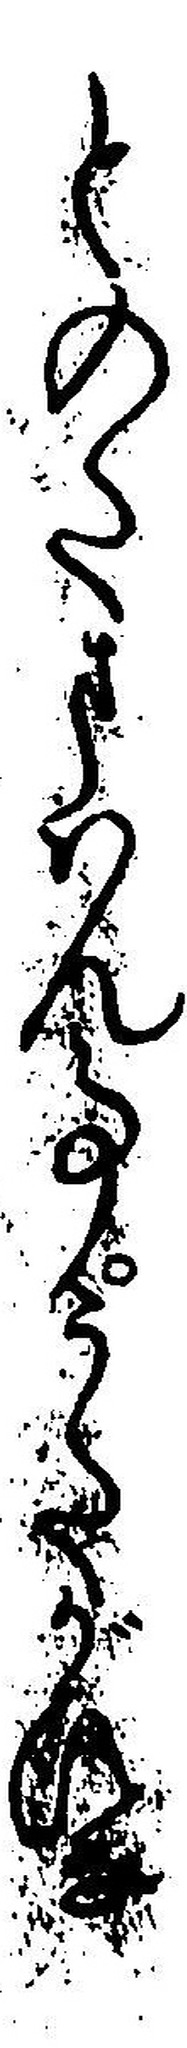とのたまはん事。うたがひな
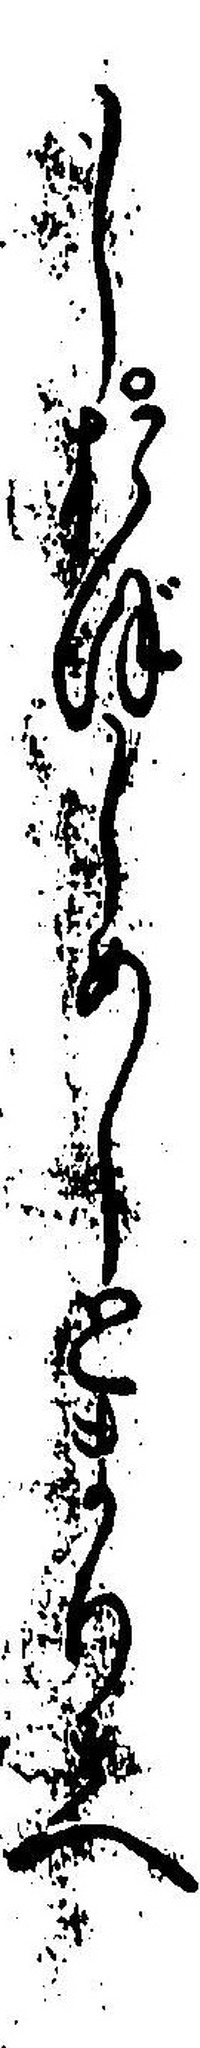し。おぼしめしとまり候へ

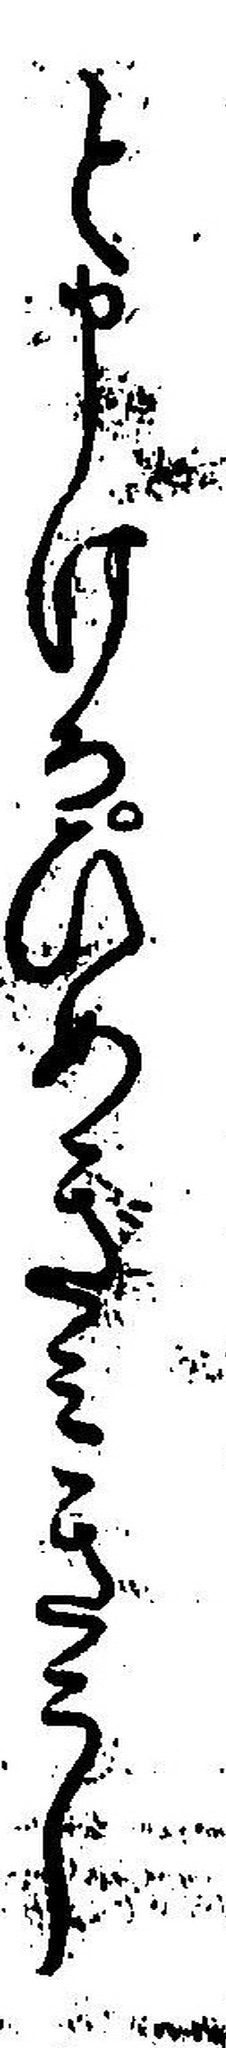と申ける。ひめぎみきこし
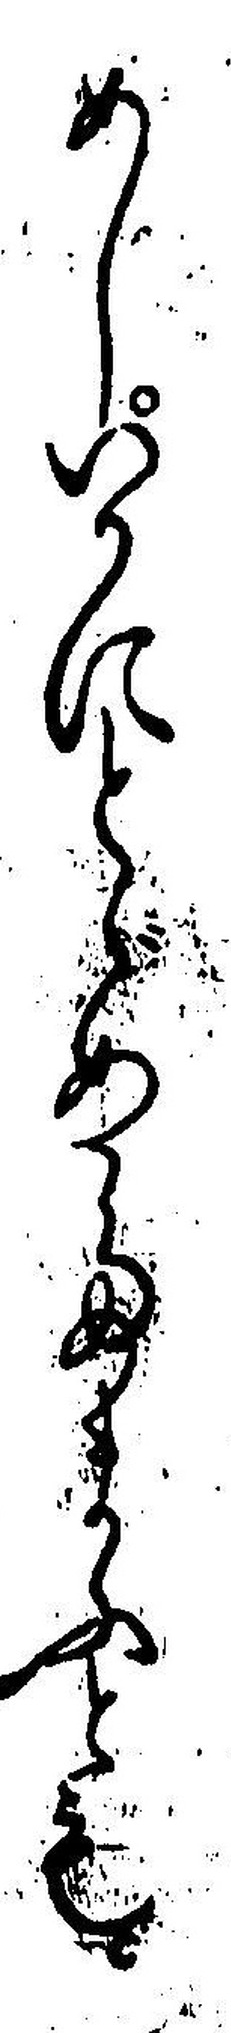めし。いかにとゞめたまふとも。
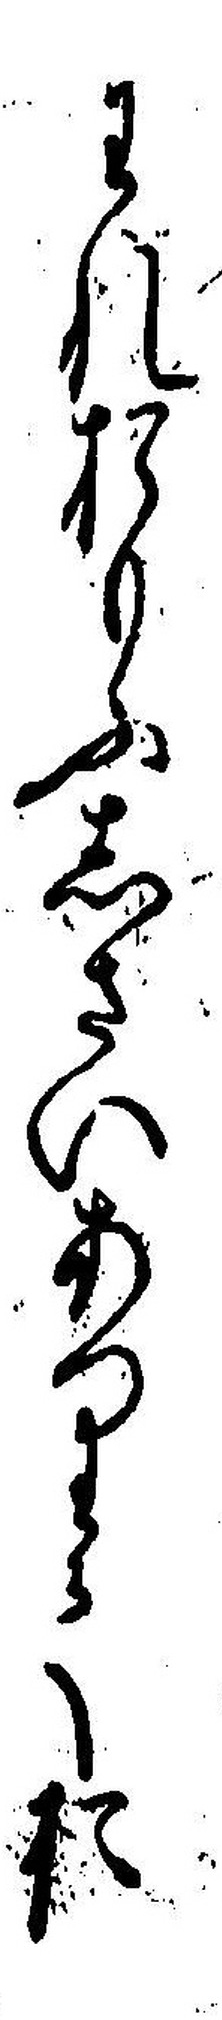われおもふしさいありてお
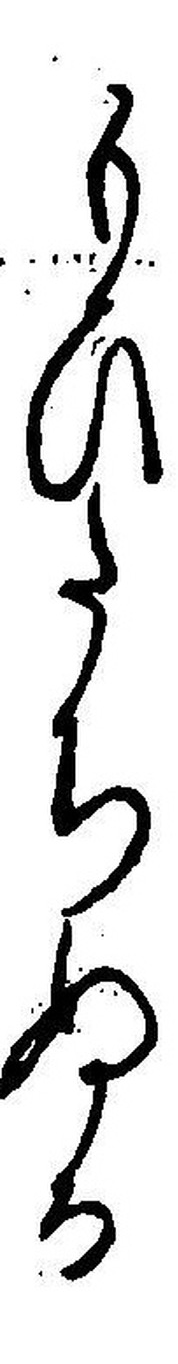もひたちぬる
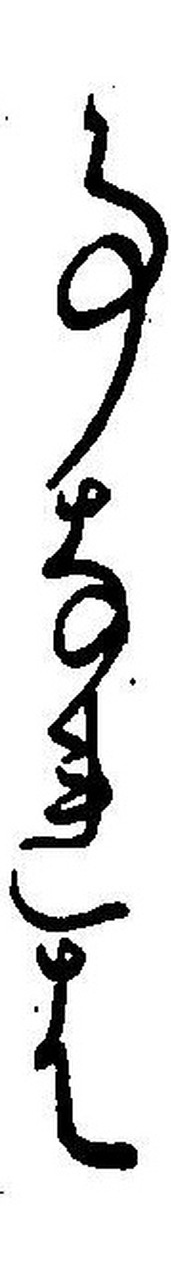事なれは
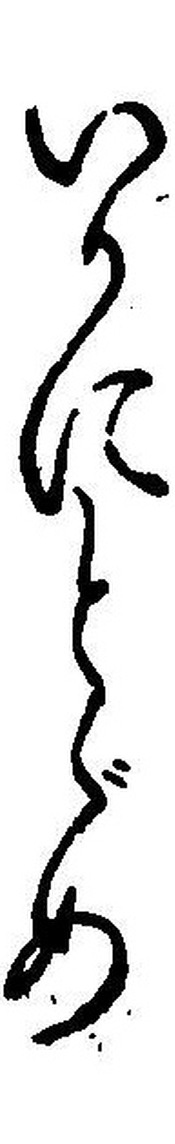いかにとゞめ
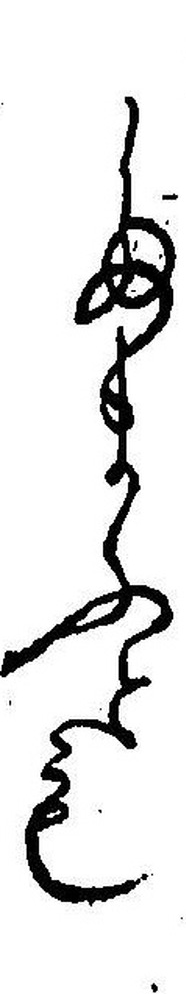たまふとも
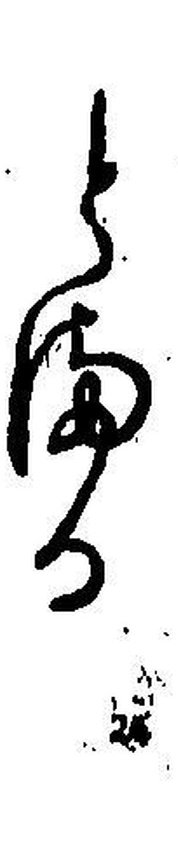とまる
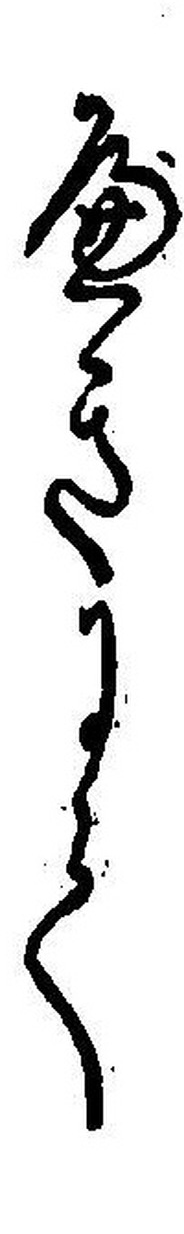べきにて
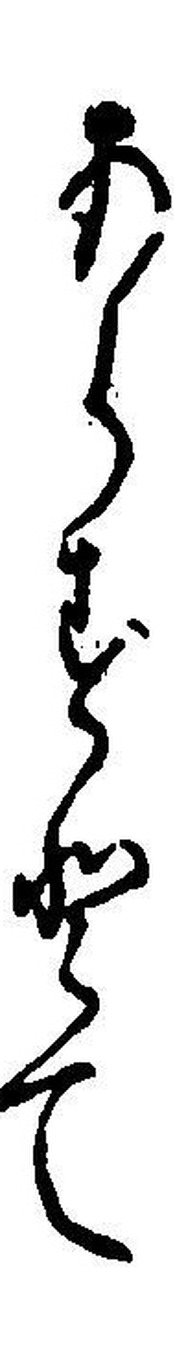あらずとて
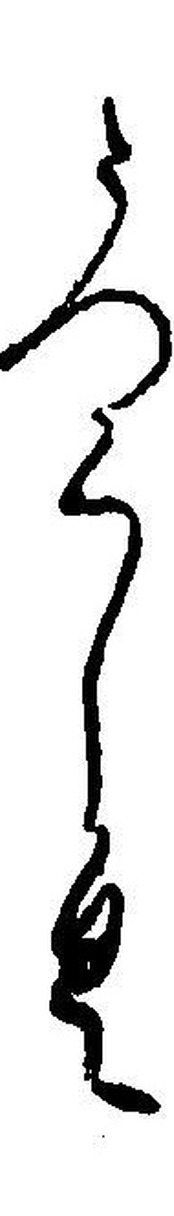うつくしく
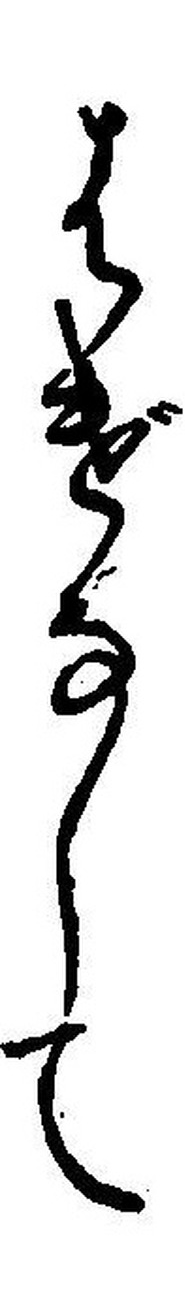はげなして
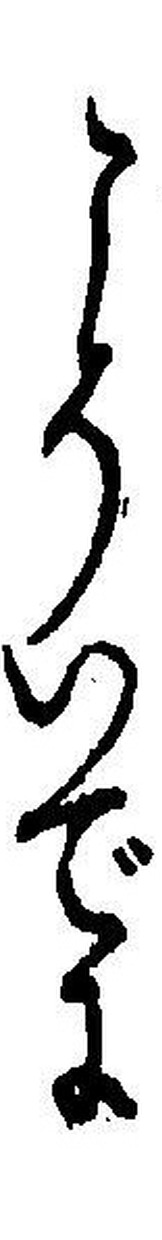こそいでに
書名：木幡きつね
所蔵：東京大学総合図書館 General Library in the University of Tokyo, JAPAN
